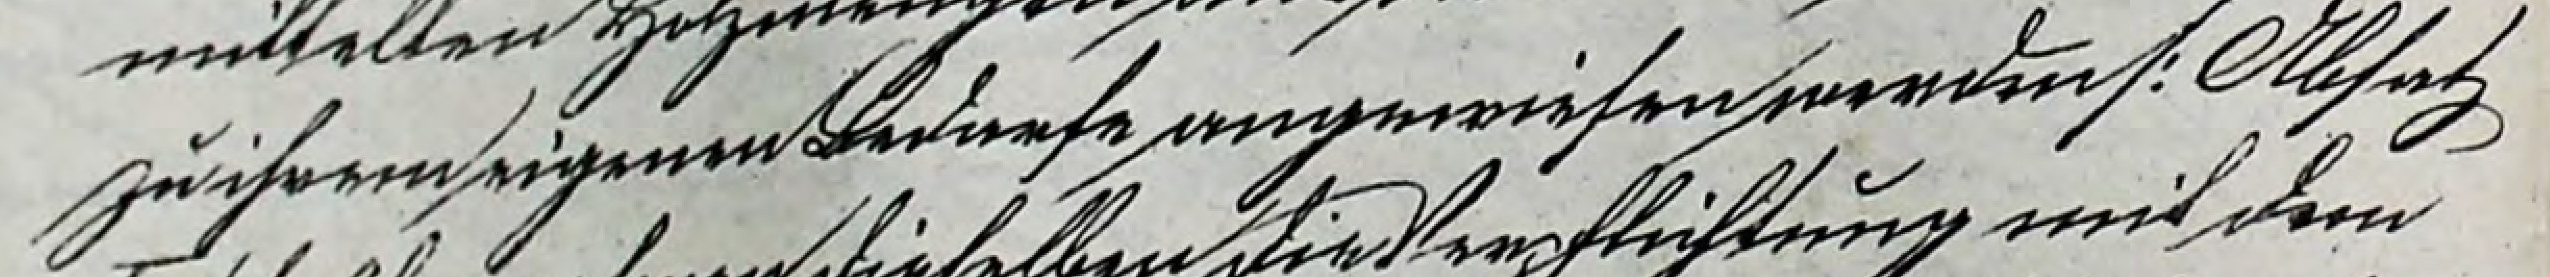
zu ihrem eigenen Bedarfe angewiesen werden /: Absatz
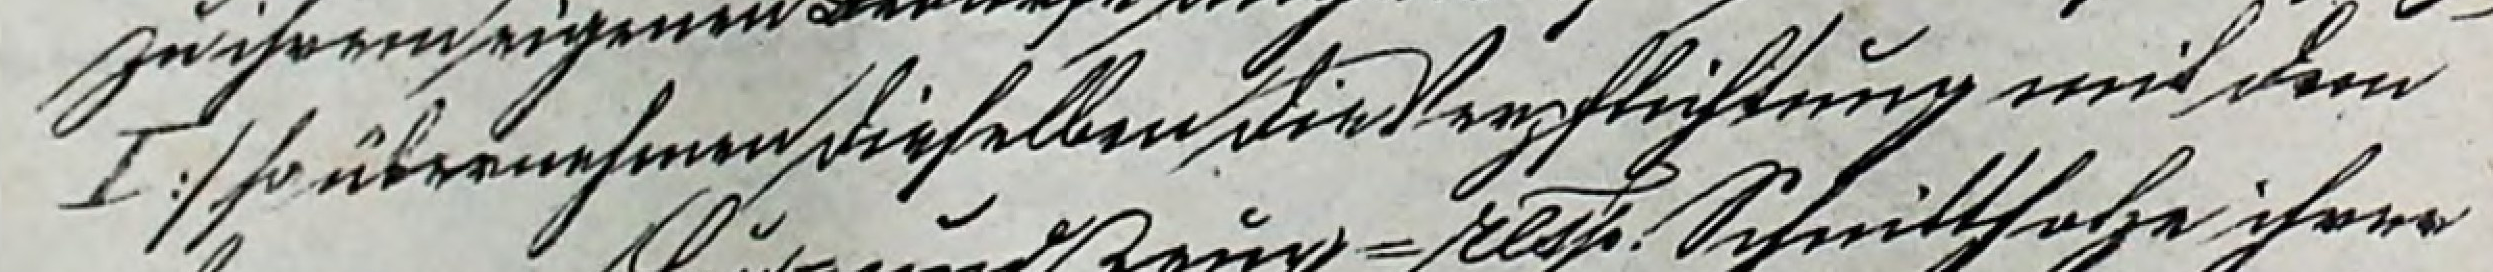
I :/ so übernehmen dieselben die Verpflichtung mit dem
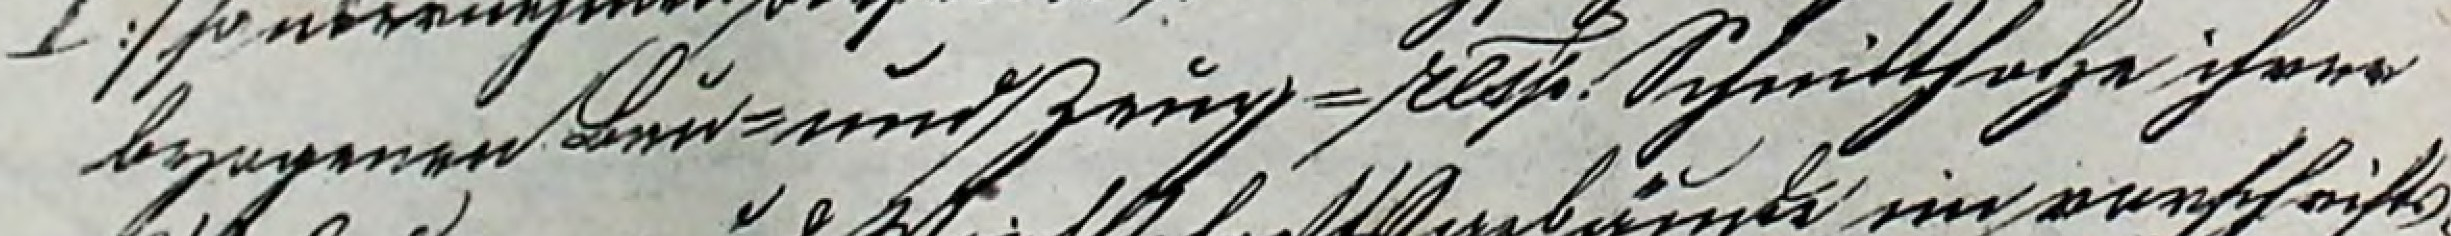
bezogenen Bau= und Zeug=resp. Schnittholze ihrer
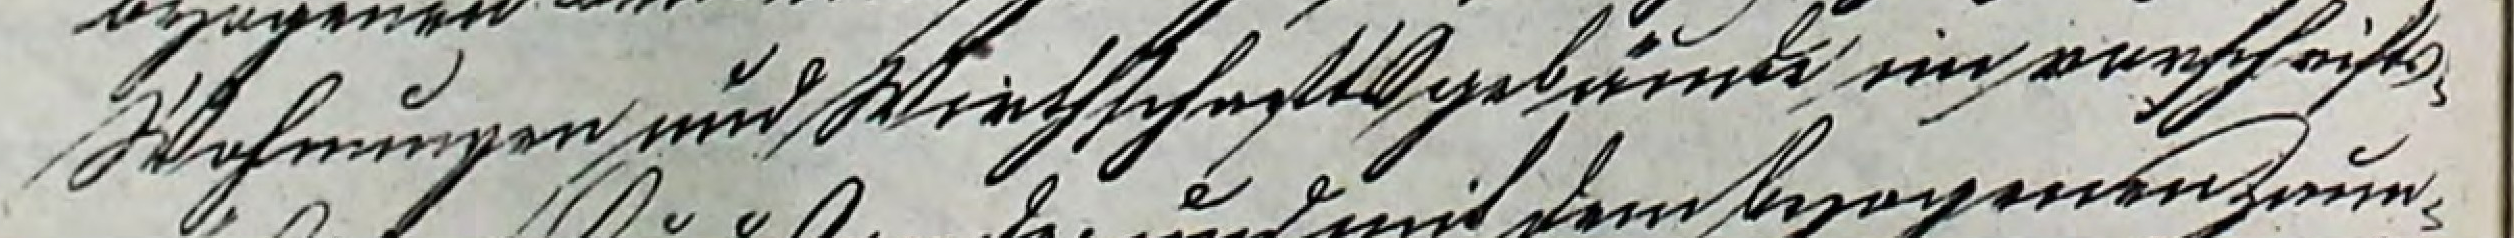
Wohnungen und Wirthschaftsgebäude, im vorschrifts„
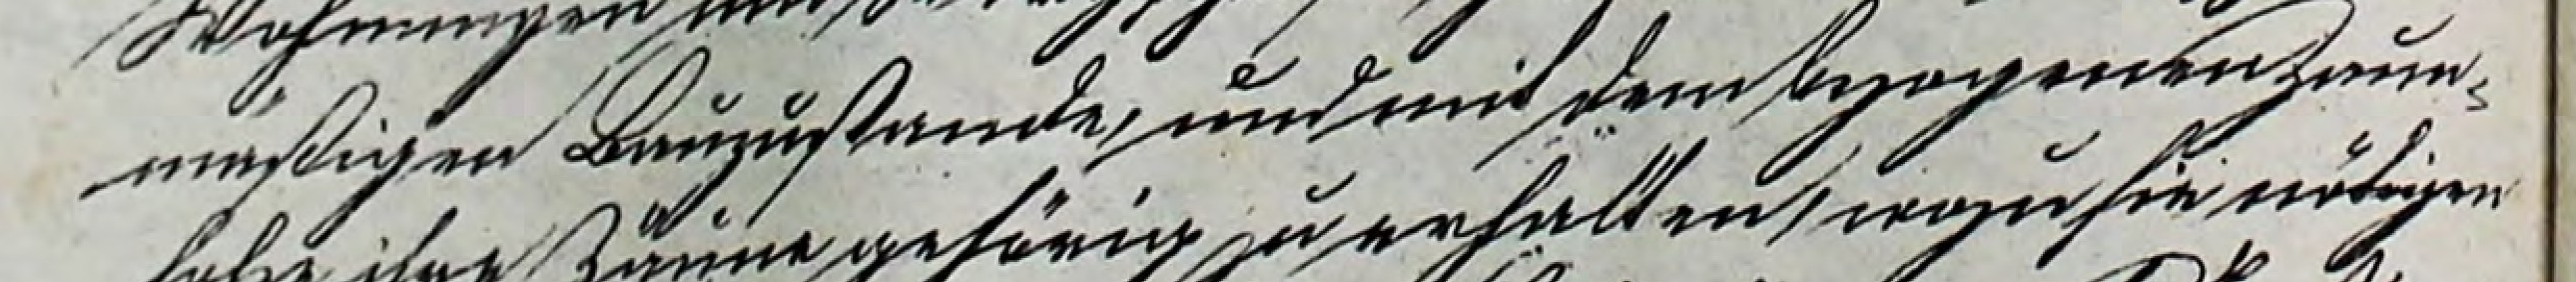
mäßigen Bauzustande, und mit dem bezogenen Zaun„
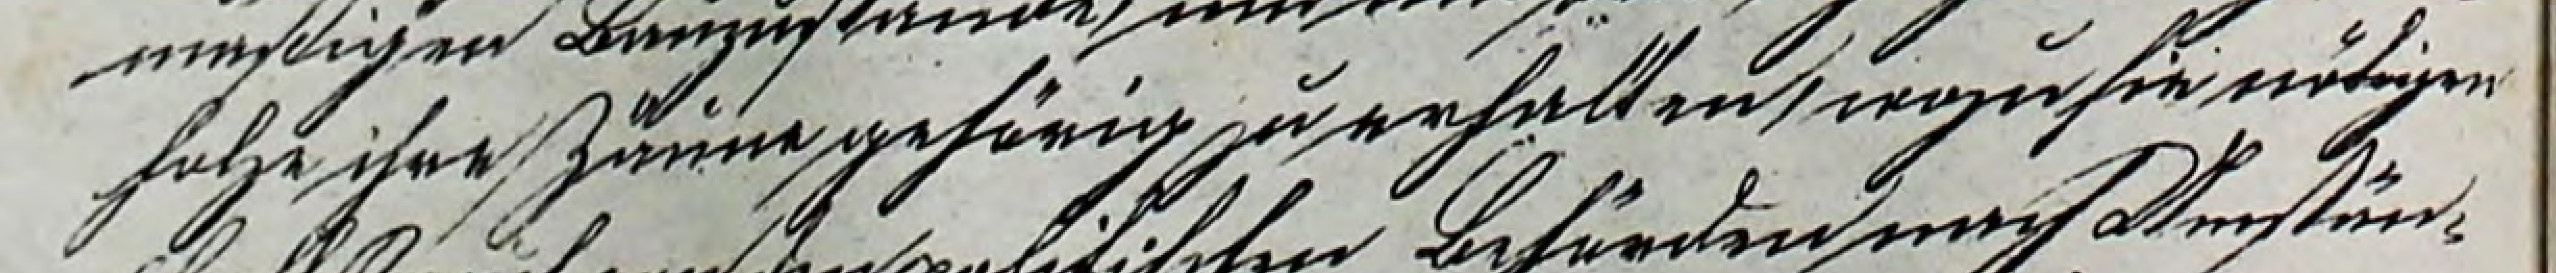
holze ihre Zäune gehörig zu erhalten, wozu sie nötigen
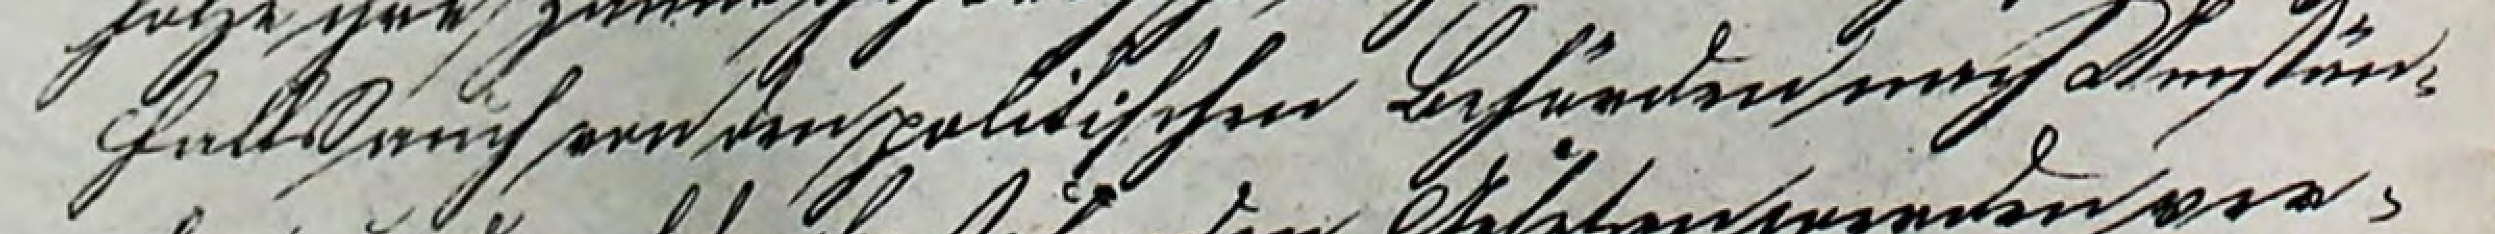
Halts auch von den politischen Behörden nach Umstän„
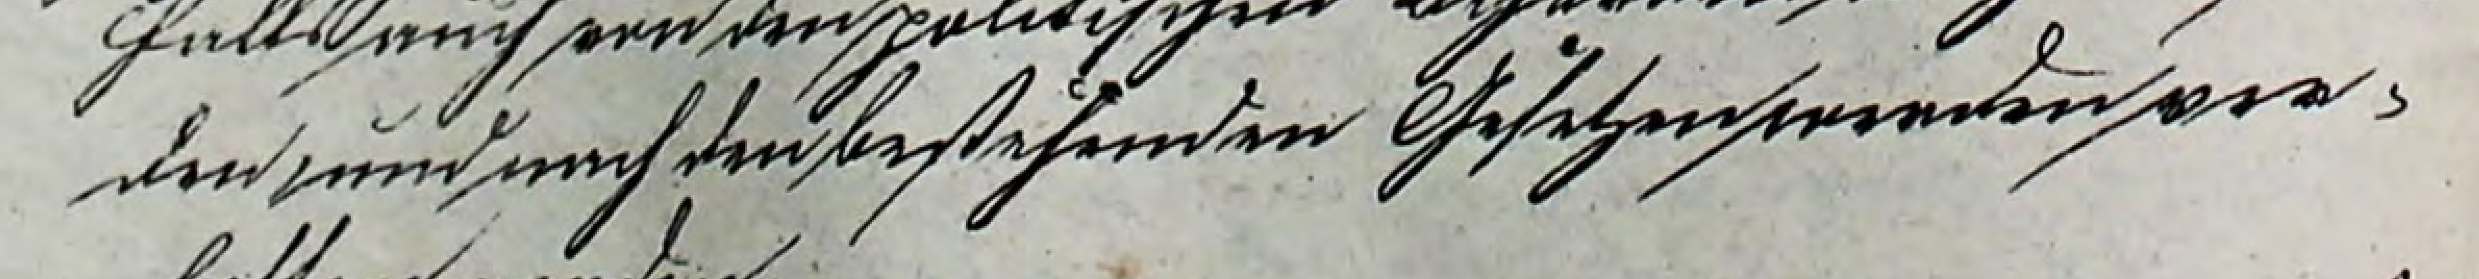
den, und nach den bestehenden Gesetzen werden ver„
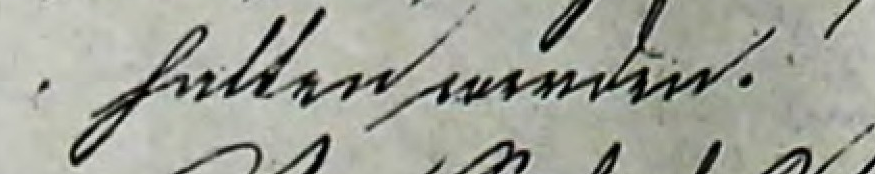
halten werden.
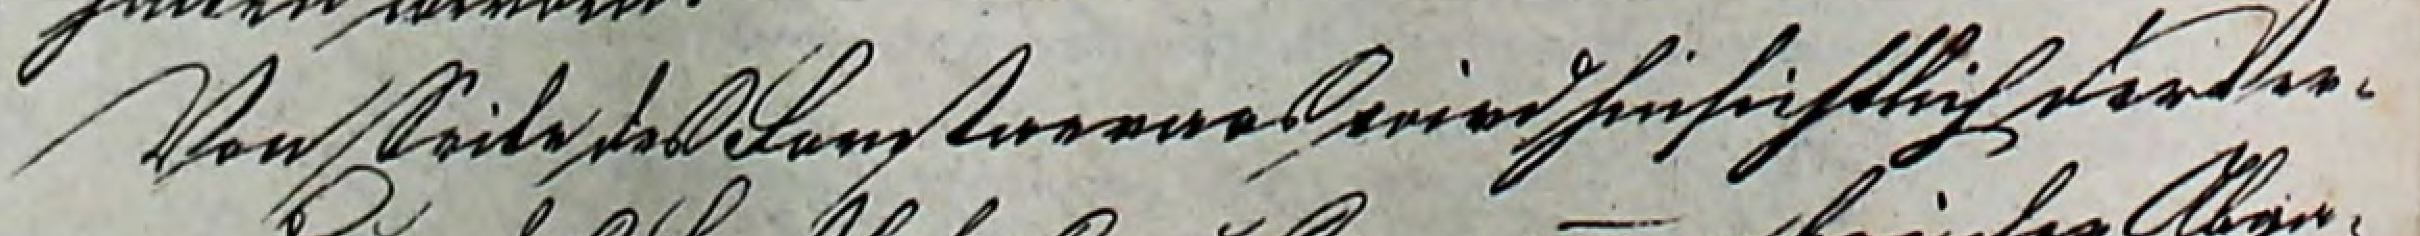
Von Seite des Forstaeraes wird hinsichtlich der Ver„
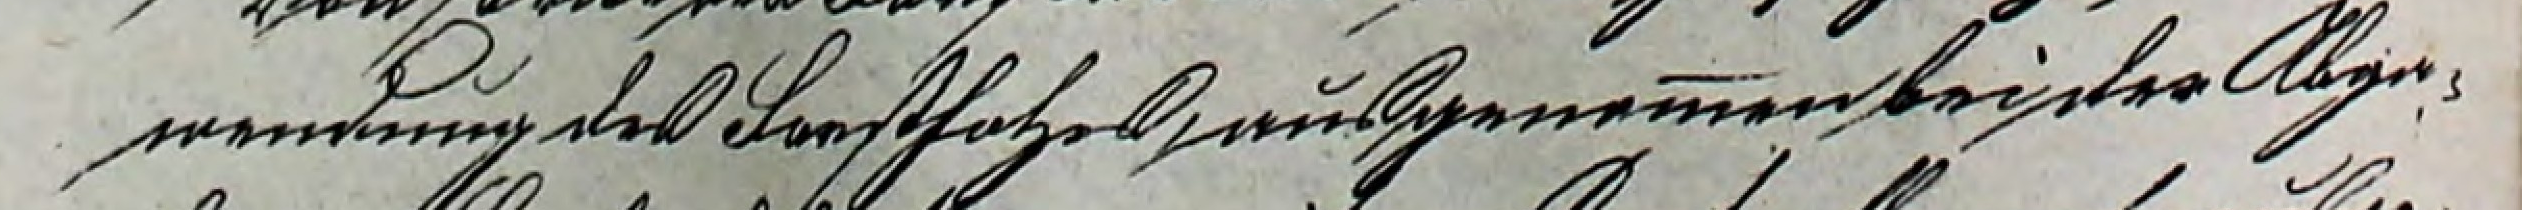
wendung des Forstholzes, aus genemmen bei der Abga„
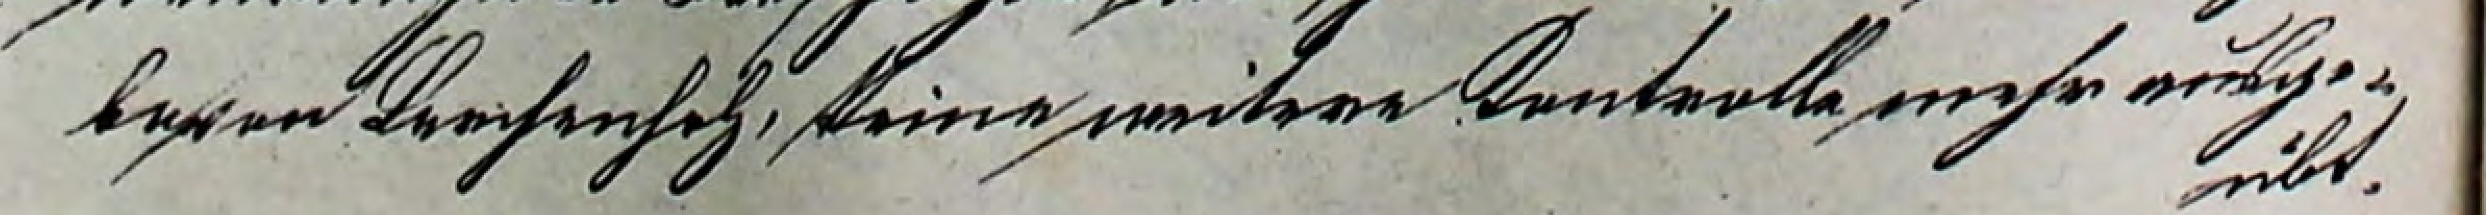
be von Lerchenholz, keine weitere Kontrolle mehr ausge„
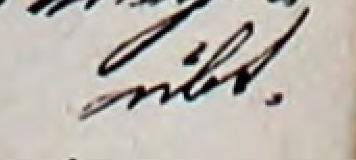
übt.
